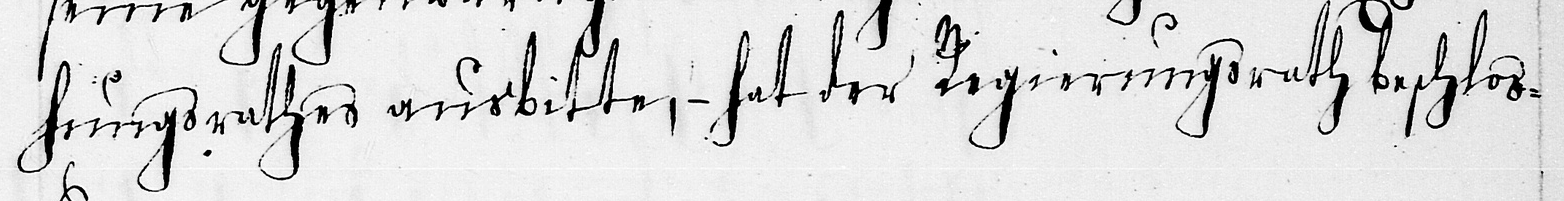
hungsrathes ausbitte, – hat der Regierungsrath beschloß¬
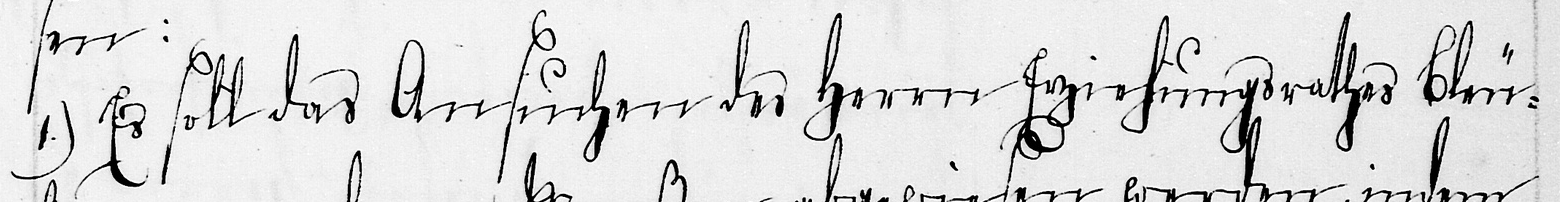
Es soll das Ansuchen des Herrn Erziehungsrathes Bleu¬
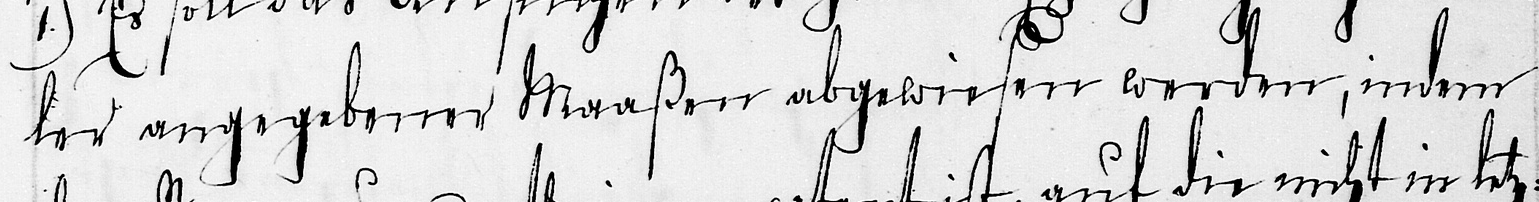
ler angegebener Maaßen abgewiesen werden, indem
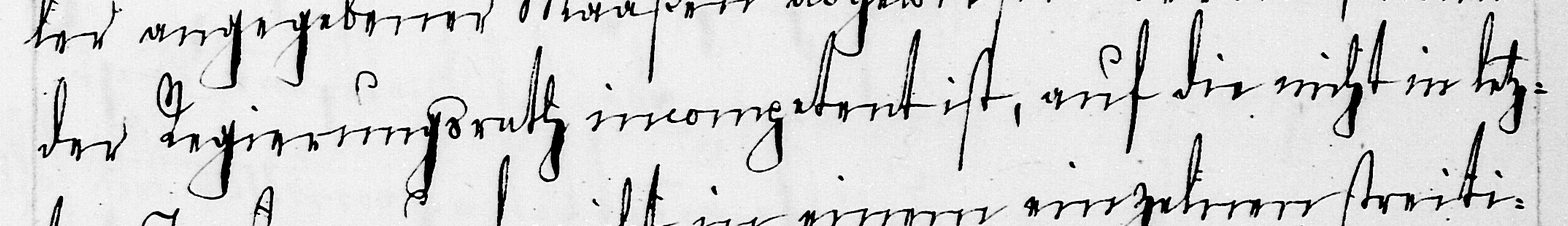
der Regierungsrath incompetent ist, auf die nicht in letz¬
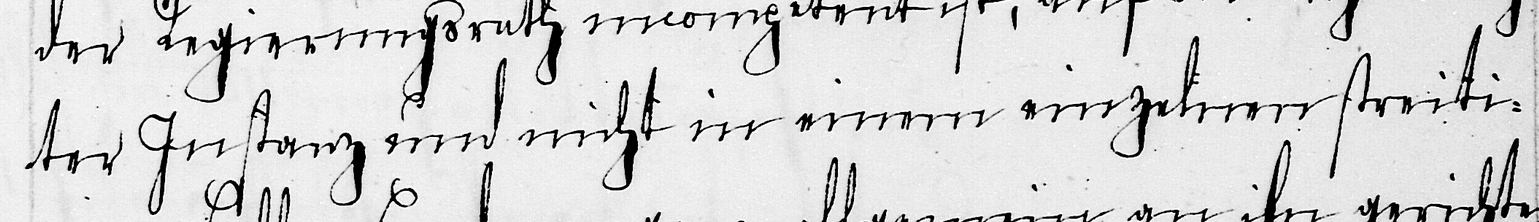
ter Instanz und nicht in einem einzelnen streiti¬
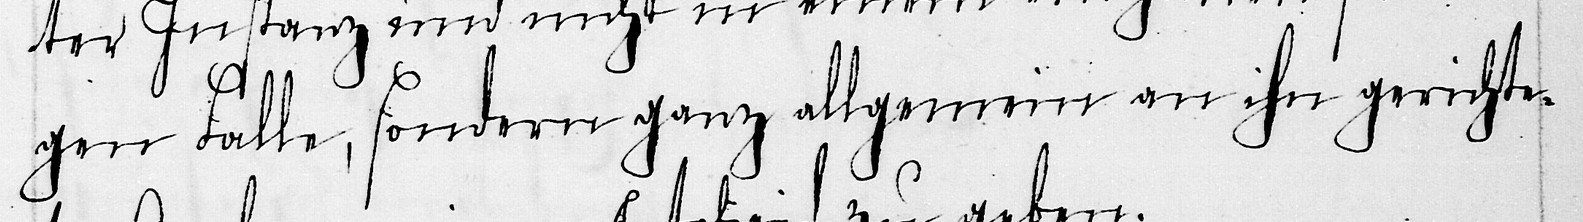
gen Falle, sondern ganz allgemein an ihn gerichte¬
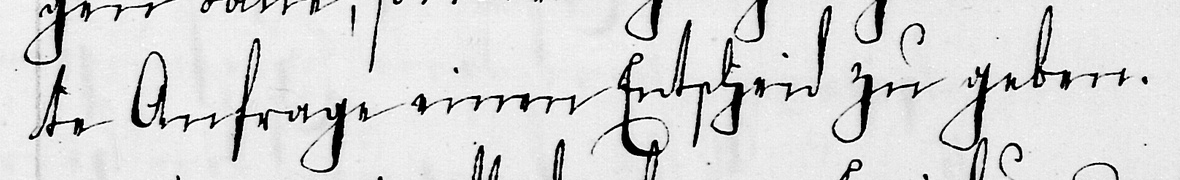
te Anfrage einen Entscheid zu geben.
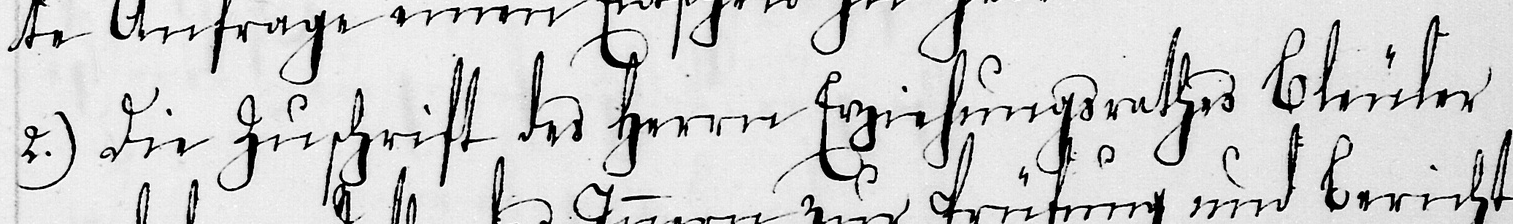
2.) Die Zuschrift des Herrn Erziehungsrathes Bleuler
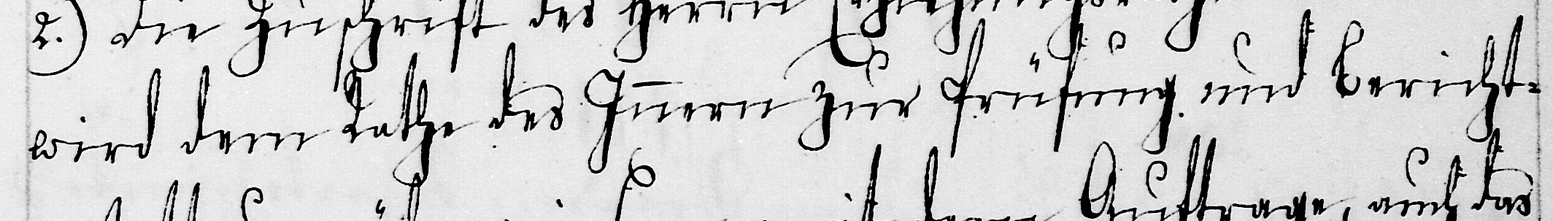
wird dem Rathe des Innern zur Prüfung und Bericht¬
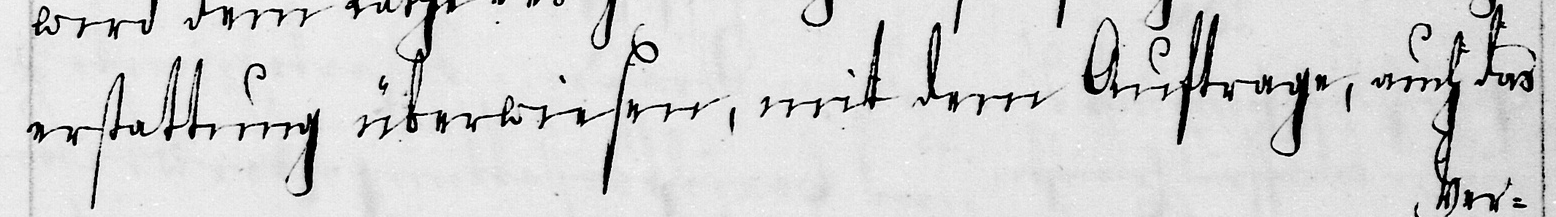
erstattung überwiesen, mit dem Auftrage, auch das
